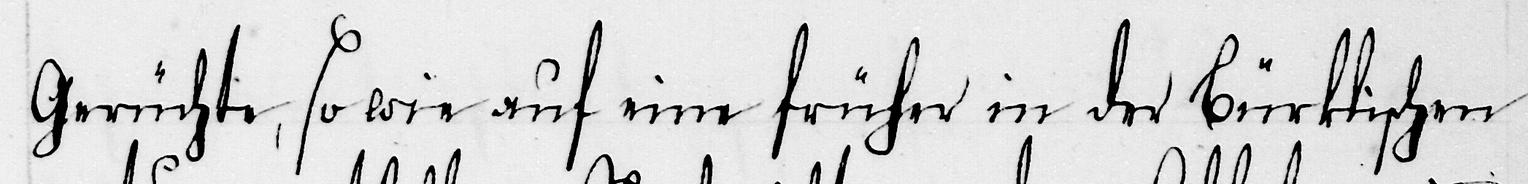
Gerüchte, sowie auf eine früher in der Bürklischen
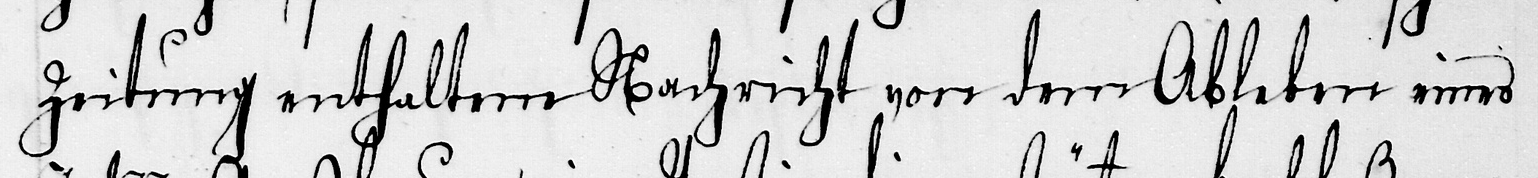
Zeitung enthaltene Nachricht von dem Ableben eines
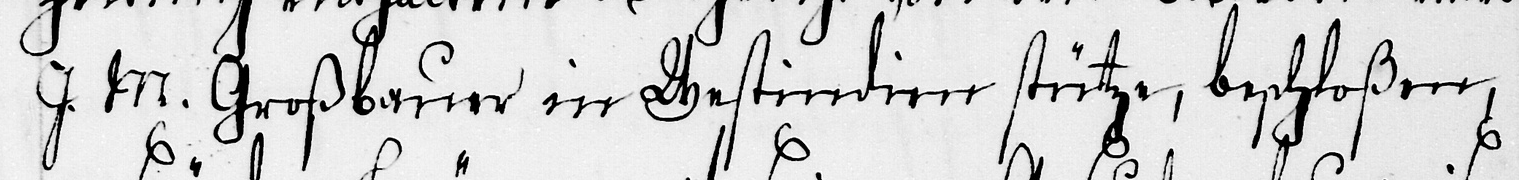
J. M. Großbauer in Westindien stütze, beschloßen,
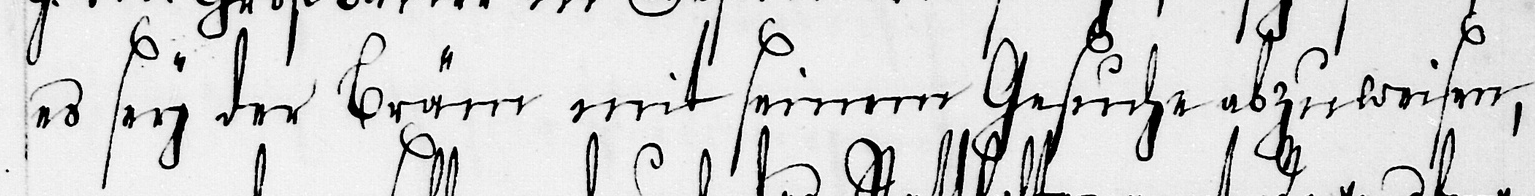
es sey der Bräm mit seinem Gesuche abzuweisen,
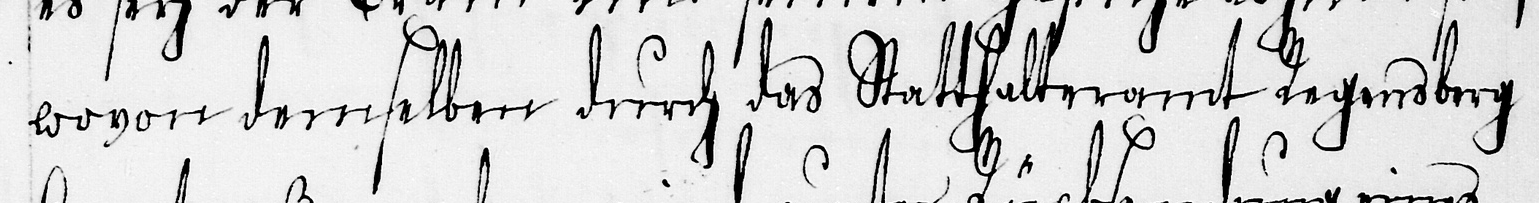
wovon demselben durch das Statthalteramt Regensberg
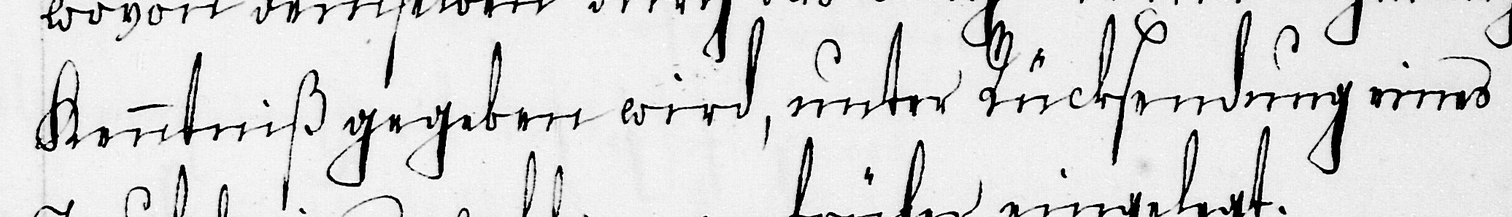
Kenntniß gegeben wird, unter Rücksendung eines
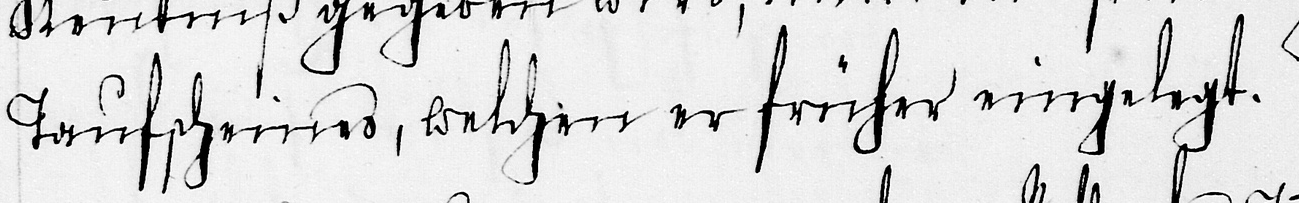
Taufscheines, welchen er früher eingelegt.
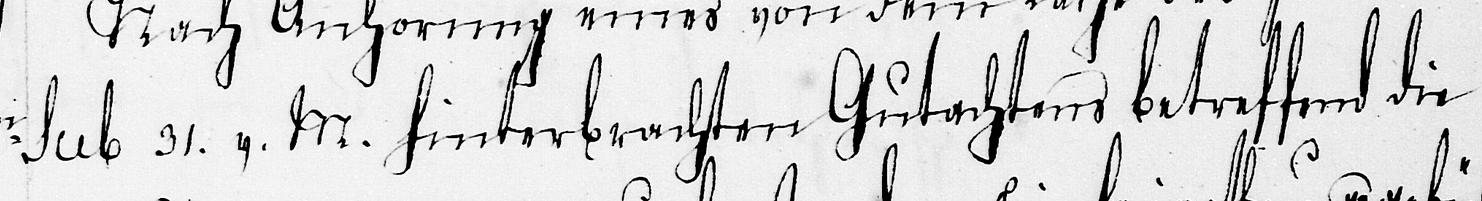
sub 31. v. M. hinterbrachten Gutachtens betreffend
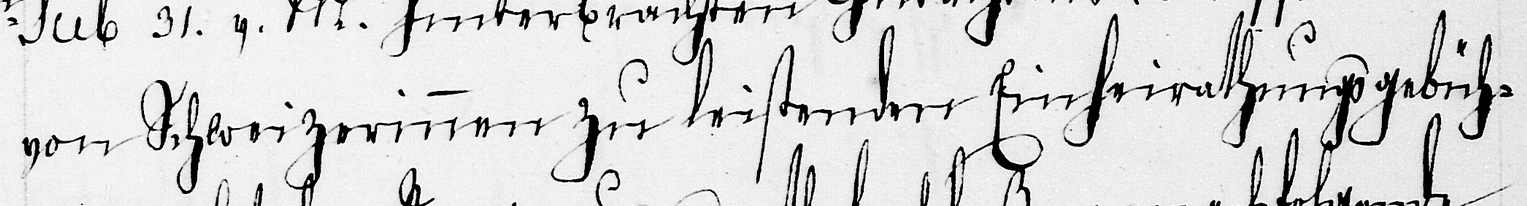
von Schweizerinnen zu leistenden Einheirathungsgebüh¬
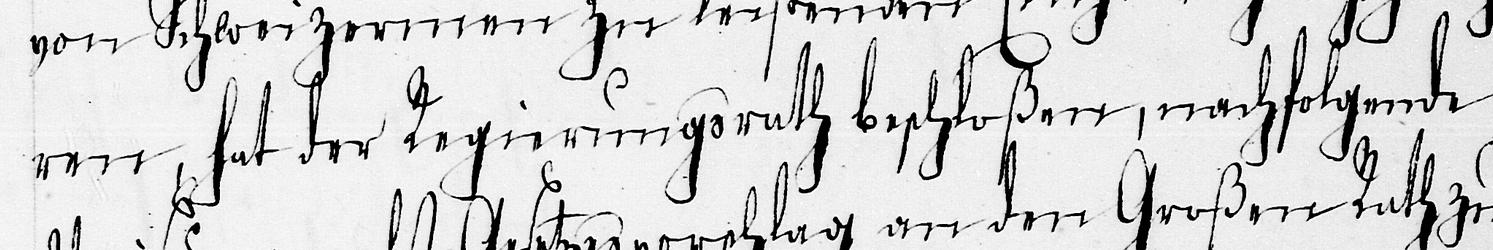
ren, hat der Regierungsrath beschloßen, nachfolgende
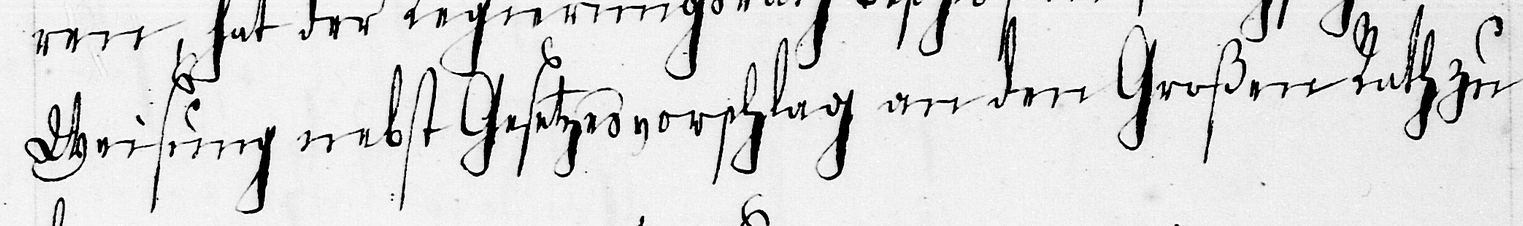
Weisung nebst Gesetzesvorschlag an den Großen Rath zu
